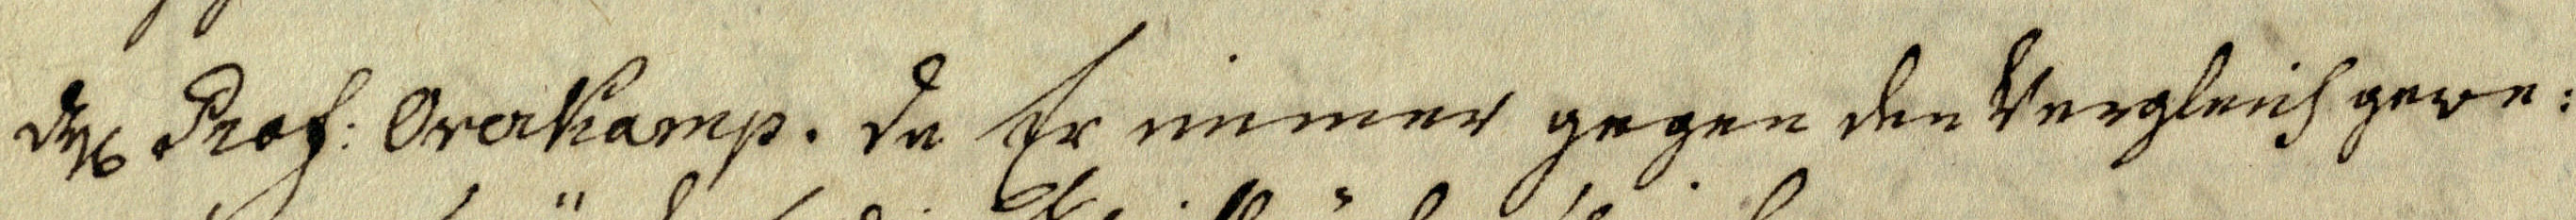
dh Prof. Overkamp. Da Er immer gegen den Vergleich gewe¬
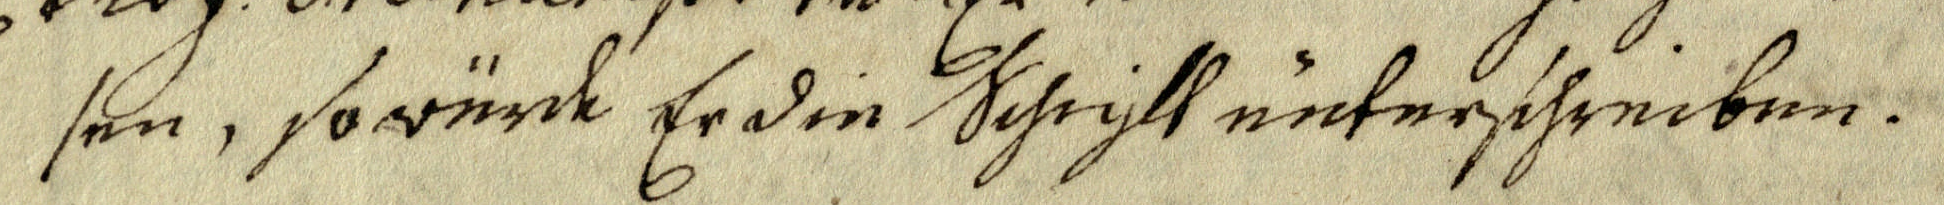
sen, so würde Er die Schrift unterschreiben.
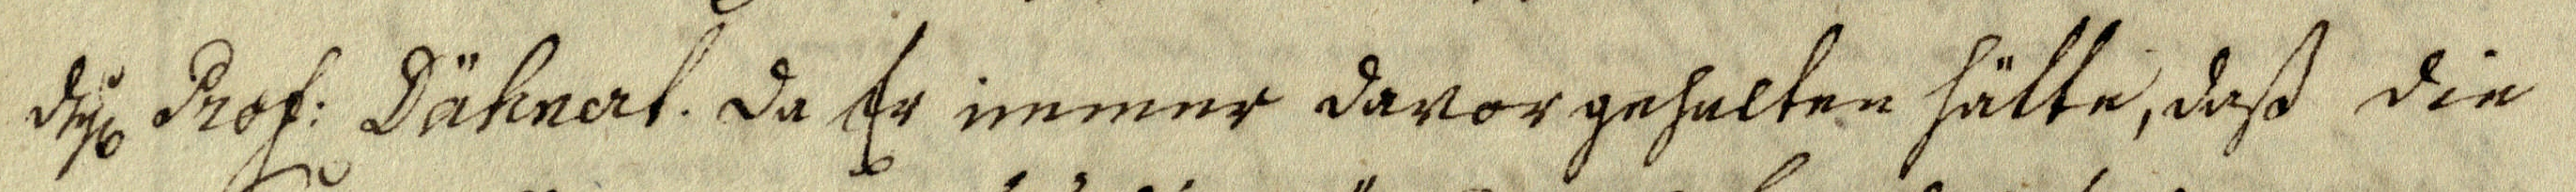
dh Prof. Dähnert. Da Er immer davor gehalten hätte, daß die
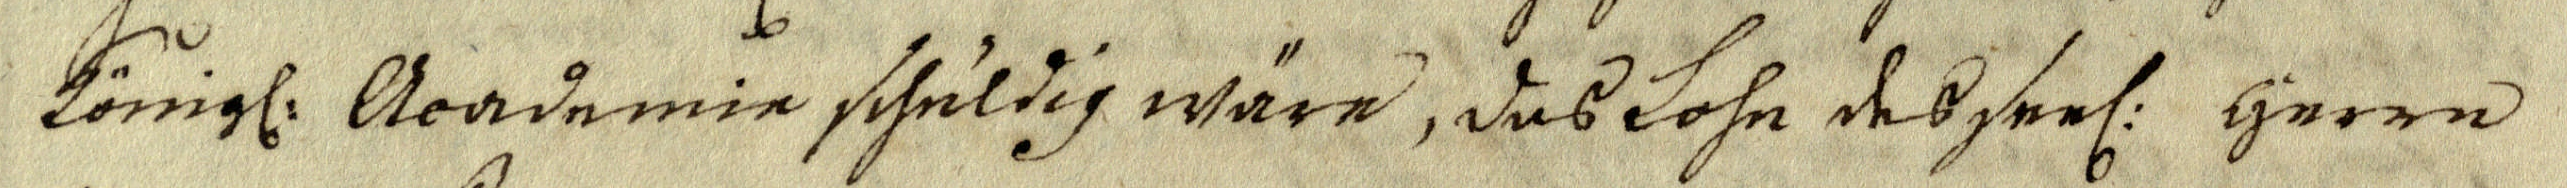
Königl. Academie schuldig wäre, das Lohn des seel. Herrn
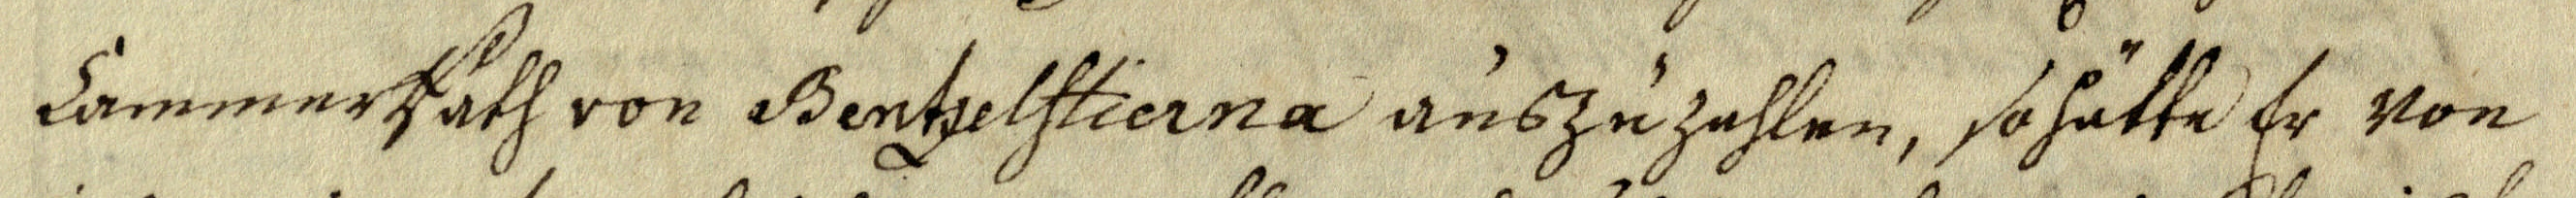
CammerRath von Bentzelstierna auszuzahlen, so hätte Er von
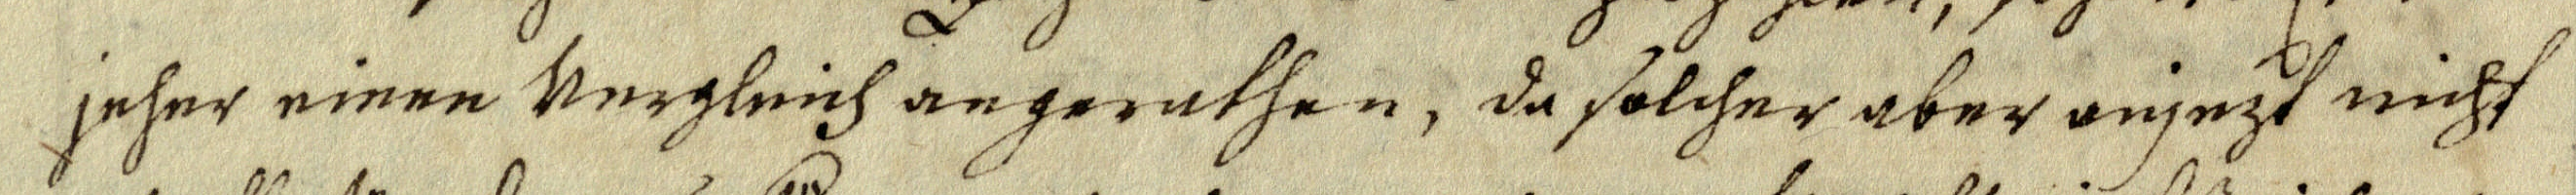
jeher einen Vergleich angerathen, da solcher aber anjezt nicht
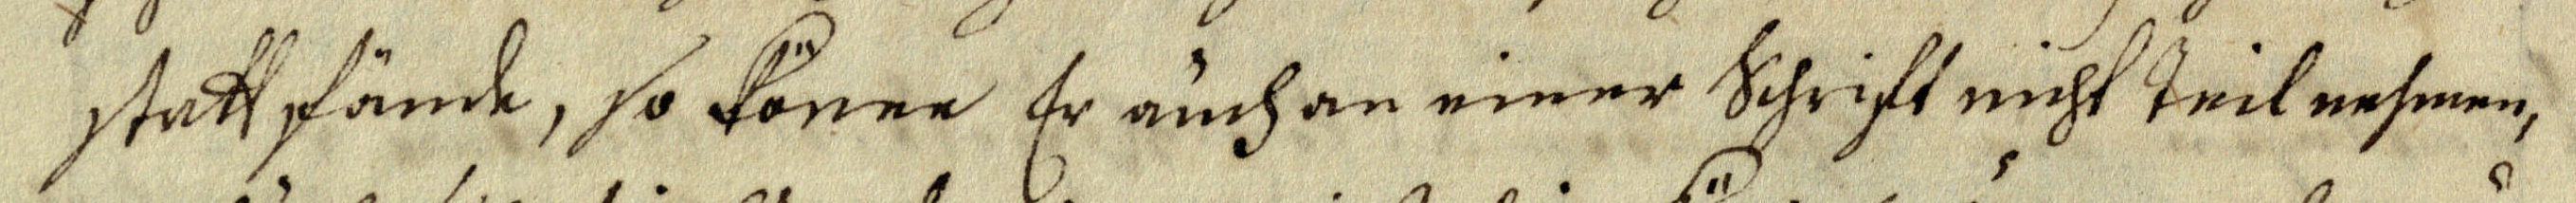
statt fände, so könne Er auch an einer Schrift nicht teilnehmen,
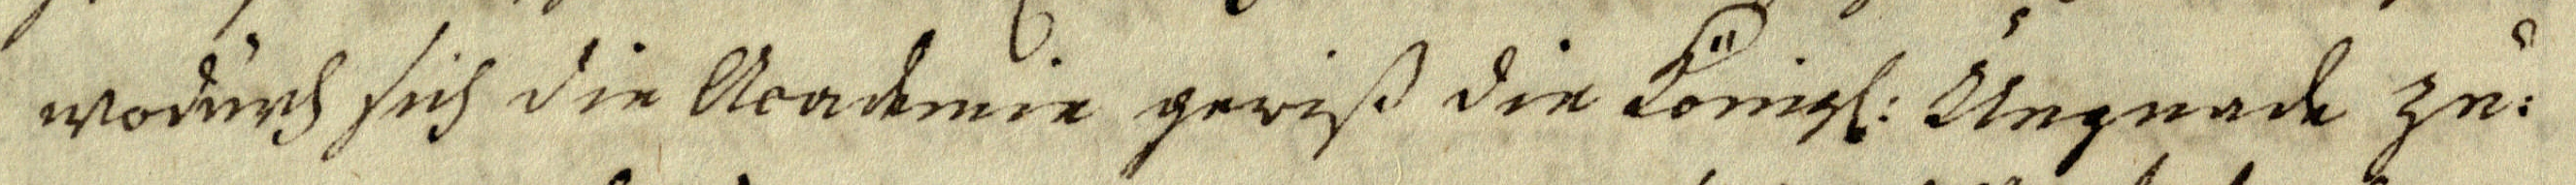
woduch sich die Academie gewiß die Königl. Ungnade zu¬
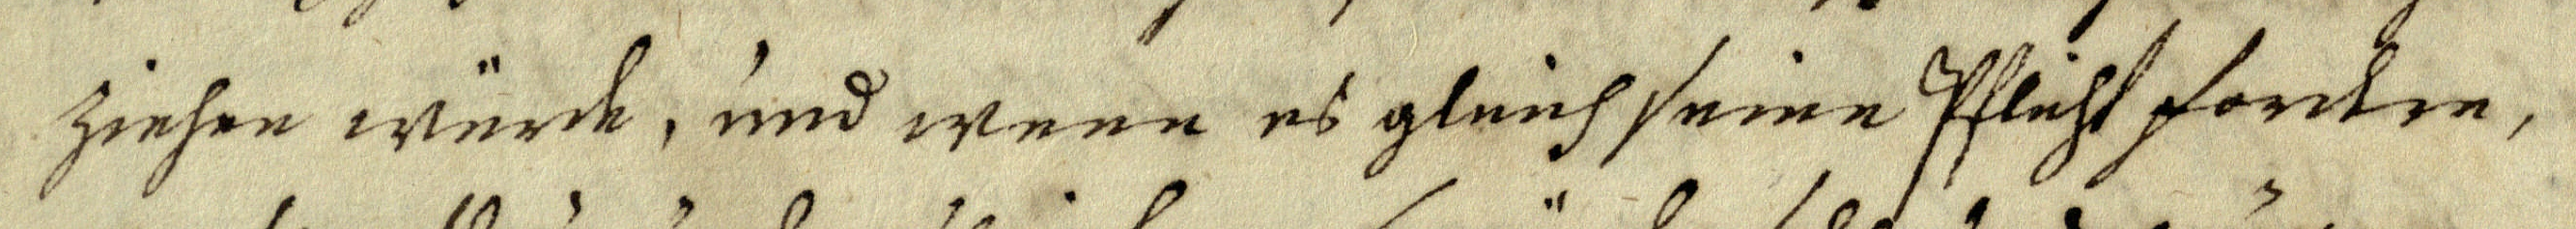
ziehen würde, und wenn es gleich seine Pflicht fordere,
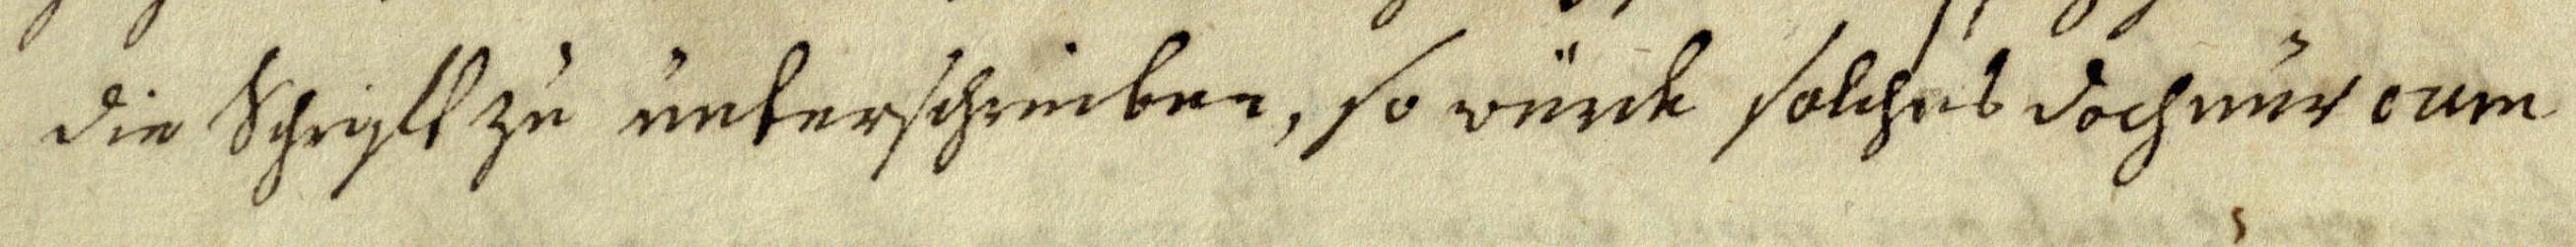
die Schrift zu unterschreiben, so würde solches doch nur cum
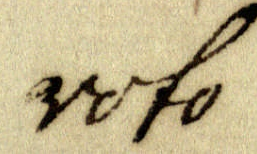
voto
